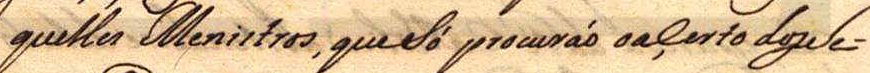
quelles Menistros, que Só procuraõ o aÇerto dos Se
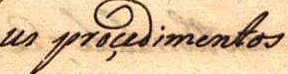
us proçedimentos
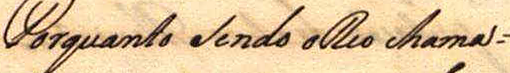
Porquanto sendo o Reo chama
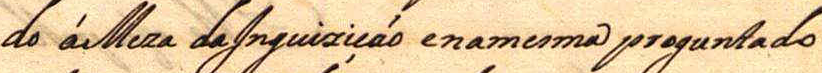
do á Mesa da Jnquizição e na mesma proguntado
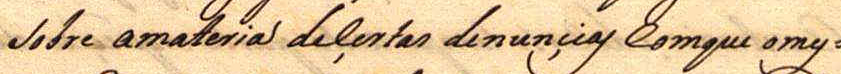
sobre a materia de Çertas denunçias com que o mes
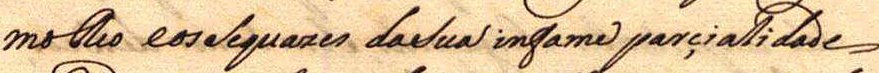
mo Reo e os Sequazes da Sua infame parçialidade
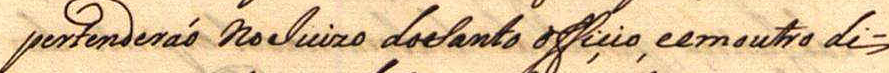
pertenderaõ no Iuizo do Santo offiçio, e em outro di
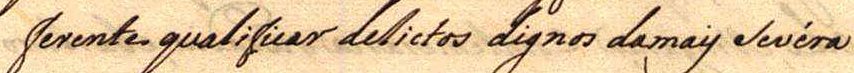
ferente qualificar delictos dignos da mais sevéra
